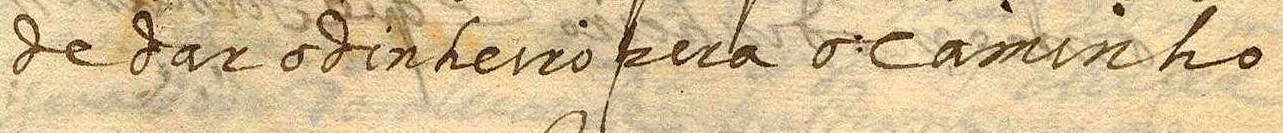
de dar o dinheiro pera o caminho
